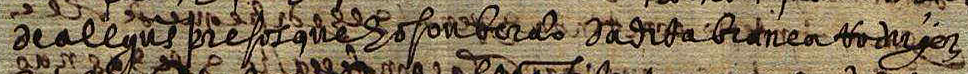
de allgūs presos que ho souberaõ da dita branca Rodrigez
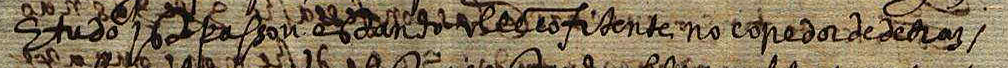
E tudo jsto passou estando ele cōfitente no corredor de detras /
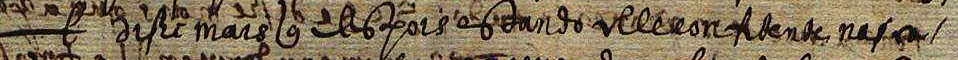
E disse mais q̄ despois estando elle confitente nas ca /
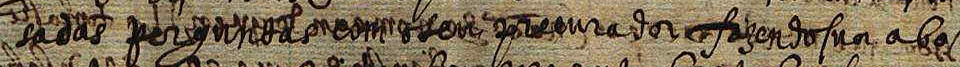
sa das perguntas com o seu precurador fazendo sua abo /
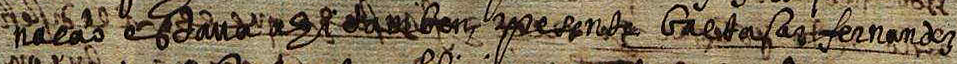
naçaõ estaua ahi tambem presente baltasar fernandez
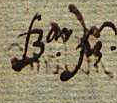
Bar. frz̄.
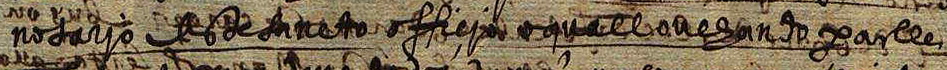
notarjo deste sancto officio o quall oulhando ꝑa elle
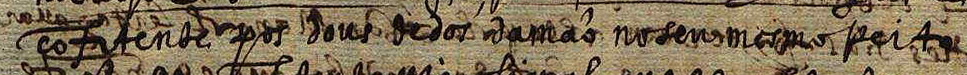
cōfitente pos dous dedos da maõ no seu mesmo peito
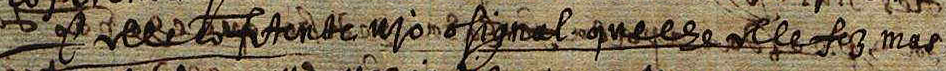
E elle cōfitente ujo o signal que lhe elle fez mas
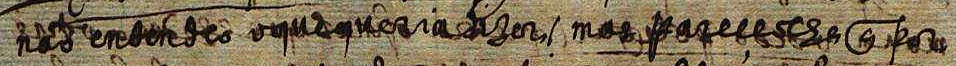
naõ entendeo o que queria dizer / mas pareceolhe q̄ por
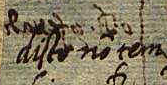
disto nō tem
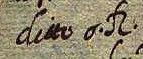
ditto o .R.
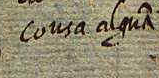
cousa alguā
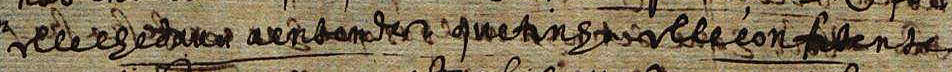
elle lhe daua a entender que tinha elle confitente
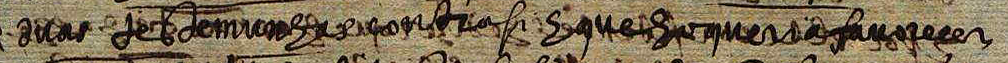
duas testemunhas contra si E que ho queria fauorecer
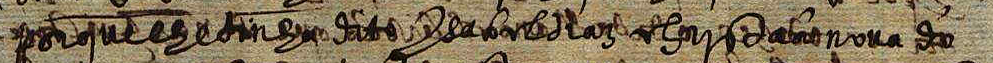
porque lhe tinha dito Jsabel diaz chrjstaā noua do
